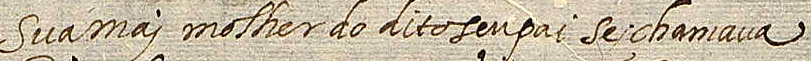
Sua maj molher do dito seu pai se çhamaua
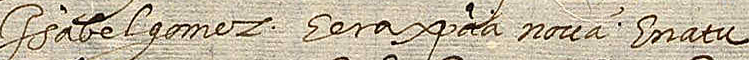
Jsabel gomez. E era xpāa noua. E natu
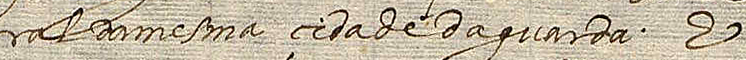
tal da mesma çidade da guarda. E
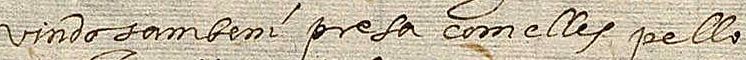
vindo tambem presa com elles pello
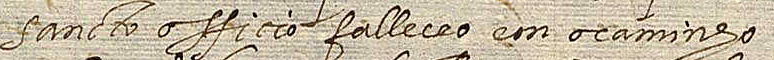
Sancto officio falleceo em o caminho
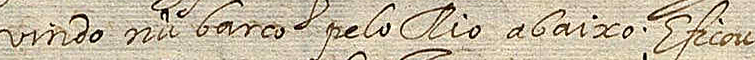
vindo nū barco pelo Rio abaixo. E ficou
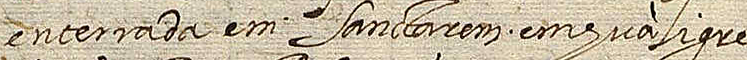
enterrada em Sanctarem. em huā igre
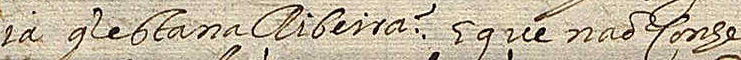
ia q̄ esta na Ribeira⹎ E que naõ Conhe
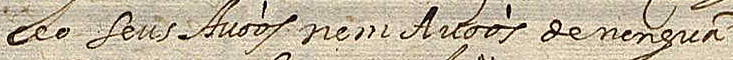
ceo seus Auoós nem Auoós de nenhuā
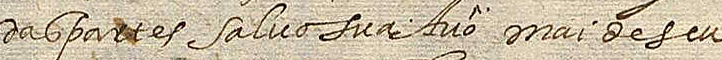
das partes Saluo sua Avô mai de seu
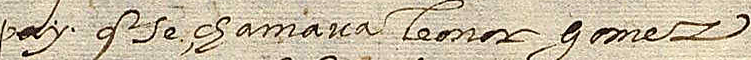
pay q̄ se çhamaua leonor gomez
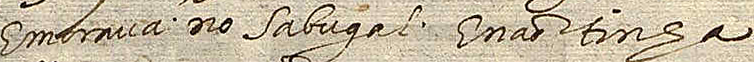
E moraua no Sabugal. E naõ tinha
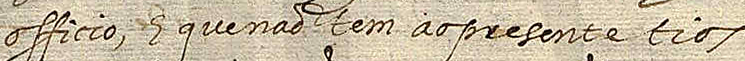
officio, E que naõ tem ao presente tios
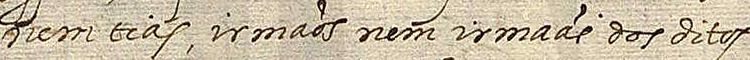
nem tias, irmaõs nem irmaās dos ditos
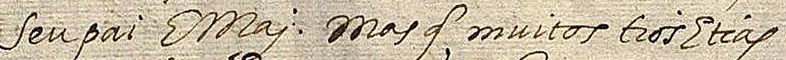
seu pai E Maj. mas q̄ muitos tios E tias
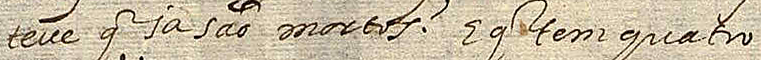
teue q̄ ia saõ mortos⹎ E q̄ tem quatro
